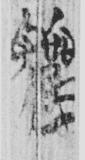○（觀）
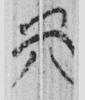亓（其）
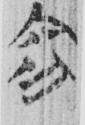容
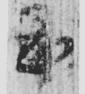㠯（以）
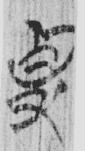○（使）
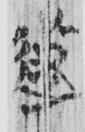﨤（及）
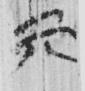亓（其）
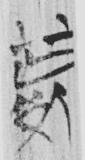○（葬）
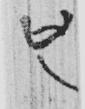也
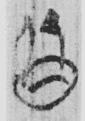皆
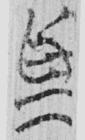爲
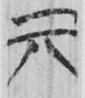亓（其）
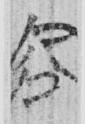容
